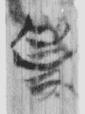事
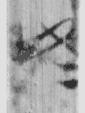女
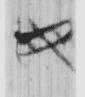母
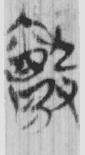{㐭白水殳}
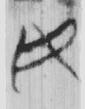女
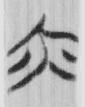亦
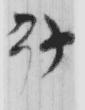引
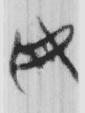母
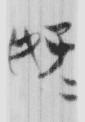好
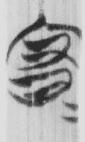宏
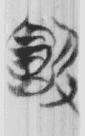{會刀又}
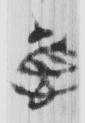惪
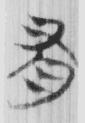有
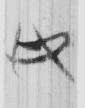女
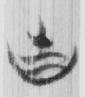由
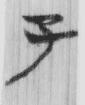子
